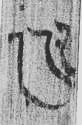川（順）
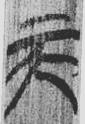天
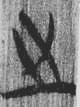之
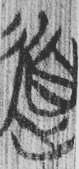道
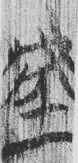○（吾）
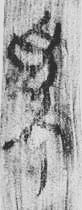○（奚）
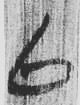㠯（以）
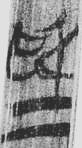爲
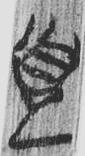頁（首）
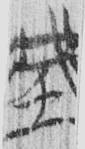○（吾）
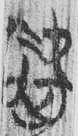欲
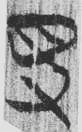○（得）
